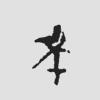不
